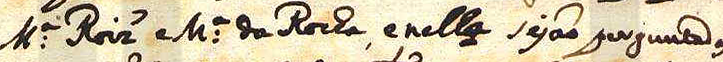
Ma: Roiz̄ e Ma: da Rocha, e nella sejaõ perguntadas
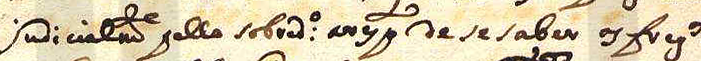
judicialmte pello sobredo: a respto de se saber as fregas.
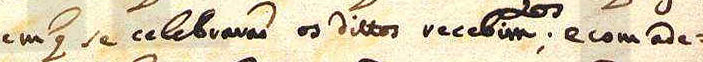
em q̄ se celebraraõ os dittos recebimtos; e com a de
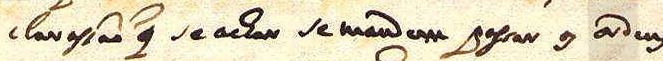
clarassaõ q̄ se achar se mandem passar as ordens
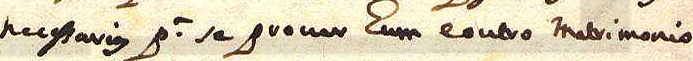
necessarias pa. se prouar hum e outro matrimonio
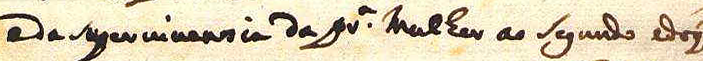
e da superuiuensia da pra. mulher ao segundo e do q̄
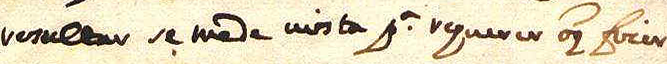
resultar se made uista pa. requerer o q̄ fizer
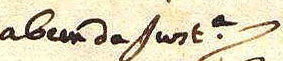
a bem da justa.
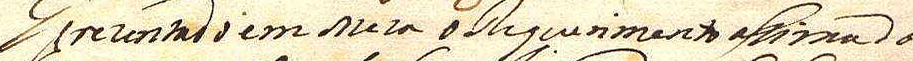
E prezentado em Meza o Requerimento assima do
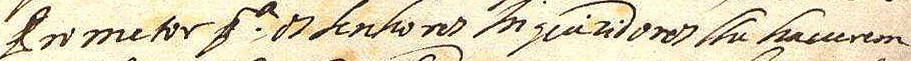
Promotor pa. os Senhores Inquizidores lhe hauerem
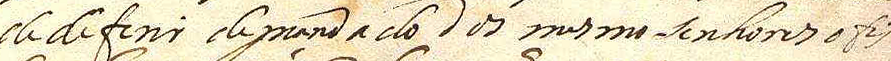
de definir de mandado dos mesmo Senhores o fis
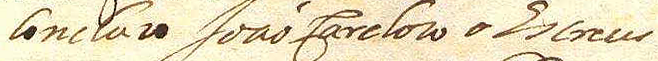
Concluzo Joaõ Cardozo o Escreui
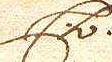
C.Lo.
